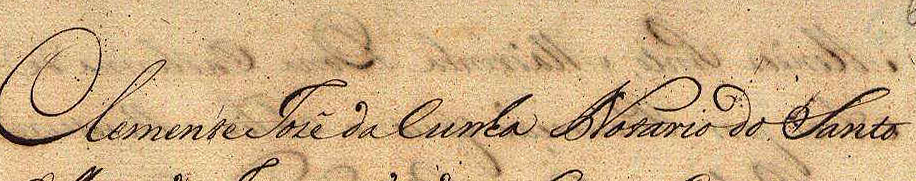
Clemente Iozé da Cunha Notario do Santo
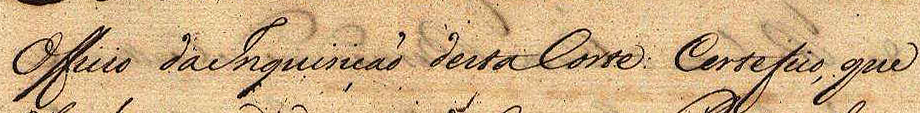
Officio da Inquisiçaõ desta Corte. Certefico, que
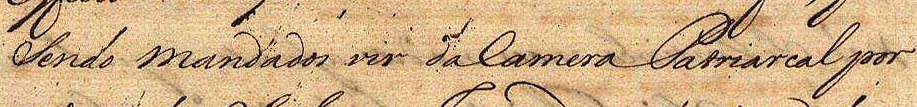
Sendo mandados vir da Camera Patriarcal por
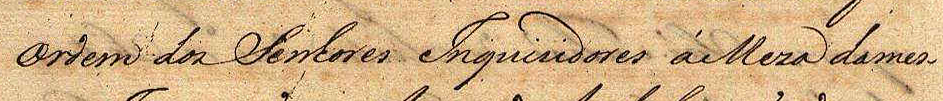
ordem dos Senhores Inquisidores á Meza da mes
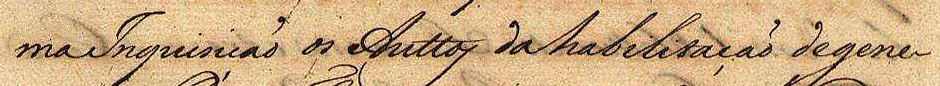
ma Inquisiçaõ os Auttos da habilitaçaõ de gene
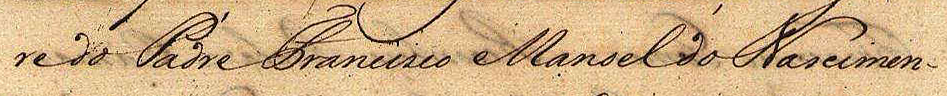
re do Padre Francisco Manoel do Nascimen
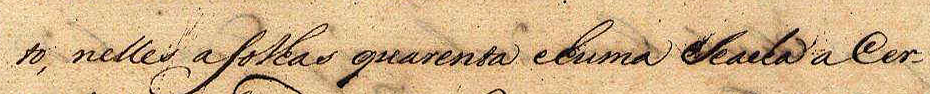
to, nelles a folhas quarenta e huma Se acha a Cer
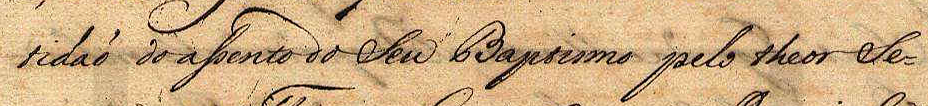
tidaõ do assento do Seu Baptismo pelo theor Se
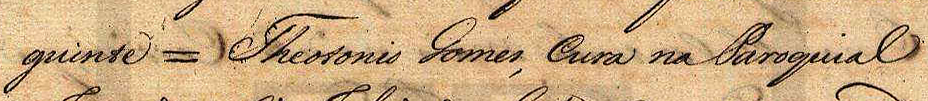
guinte = Theotonio Gomes, Cura na Paroquial
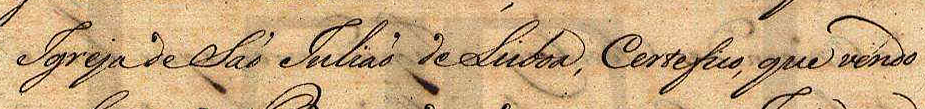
Igreja de Saõ Iuliaõ de Lisboa, Certefico, que vendo
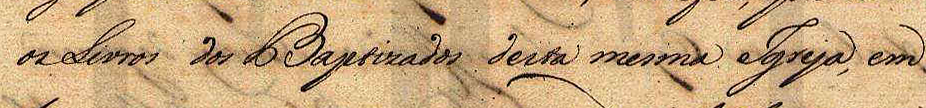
os Livros dos Baptizados desta mesma Igreja, em
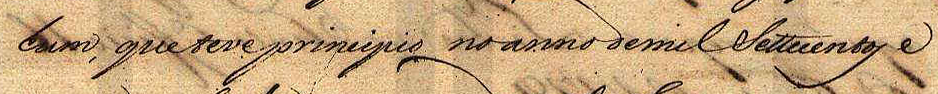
hum, que teve principio no anno de mil Settecentos e
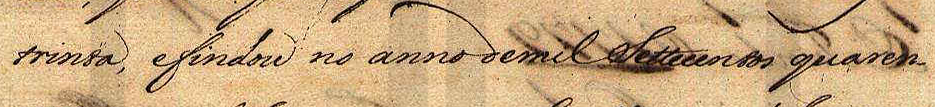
trinta, e findou no anno de mil Settecentos quaren
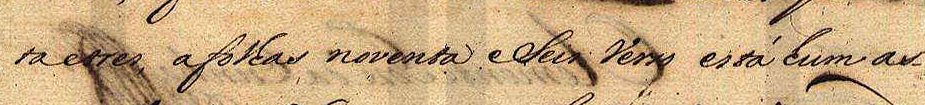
ta e tres, a follas nouenta e Seis Verso está hum as
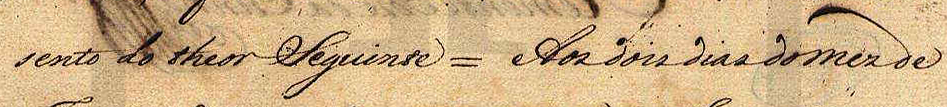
sento do theor Seguinte = Aos dois dias do mez de
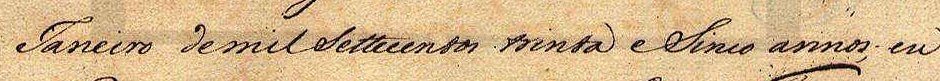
Ianeiro de mil Settecentos trinta e Sinco annos; eu
